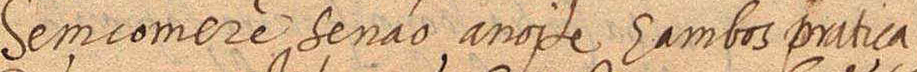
Sem comere̅ senão a nojte E ambos pratica
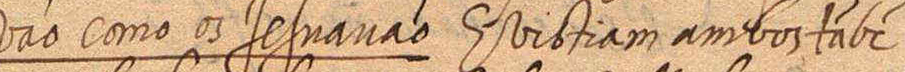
vão como os Jejuauaõ E vistiam ambos ta̅be̅
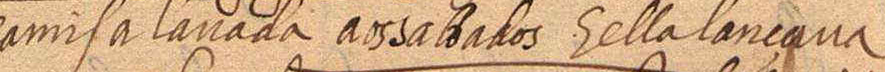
camisa lauada aos sabbados E ella lançaua
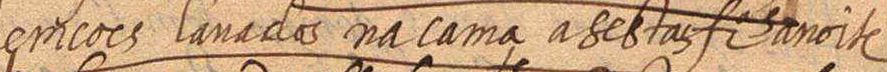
lemcoes lauados na cama a sestas fras a noite
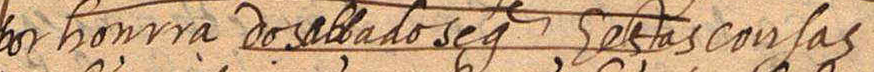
por honrra do sabbado segte E estas cousas
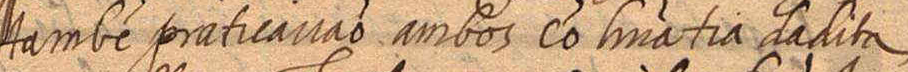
tambe̅ praticauaõ ambos co̅ hu̅a tia da dita
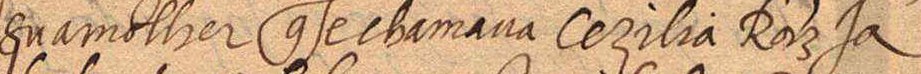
sua molher q̅ se chamaua cezilia Roi̅z Ja
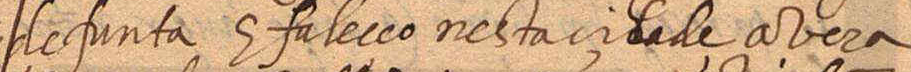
defunta E faleceo nesta çidade avera
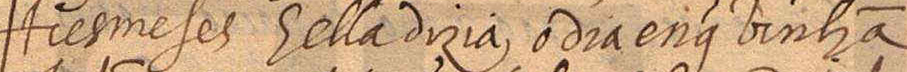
tres meses E ella dizia o dia en q̅ vinha̅
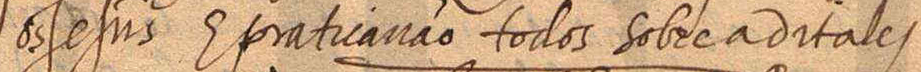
os Jeju̅s E praticauão todos sobre a dita lej
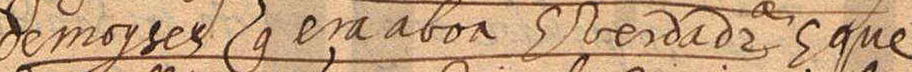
de moyses q̅ era a boa E verdadra E que
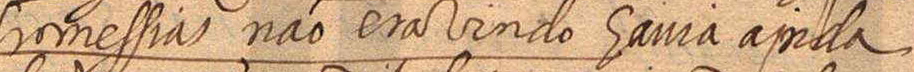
ho messias não era vindo E auia ajnda
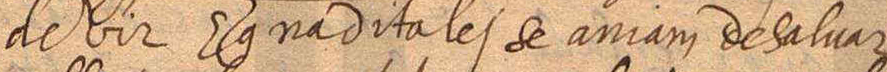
de vir E q̅ na dita lej se auiam de saluar
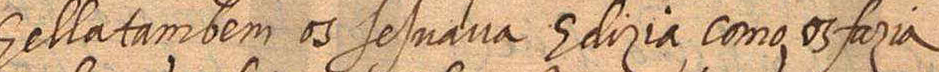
E ella tambem os JeJuaua E dizia como os fazia
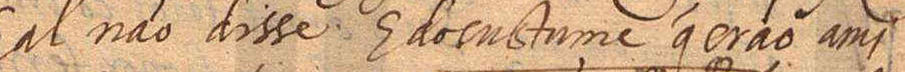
E al não disse E do custume q̅ erão amj
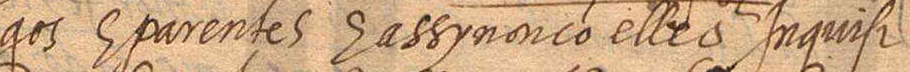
gos E parentes E assynou co̅ elle sor Jnquisi
